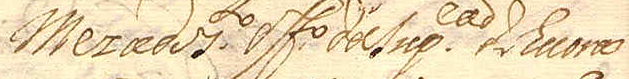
Meza do s.to off.o da Inq.ção de Euora
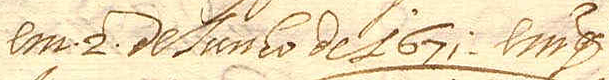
em .2. de Iunho de 167i: em q̄
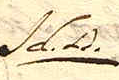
Id. 17.
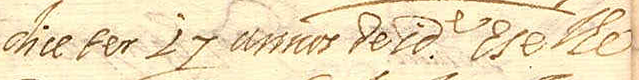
dice ter i7 annos de id.e E se lhe
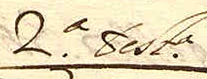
2.a test.a
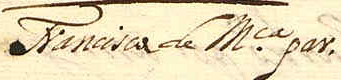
Francisca de M.ca par.
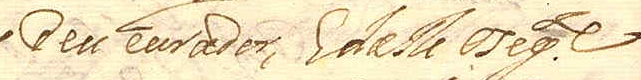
deu curador, E da Re o seg.te
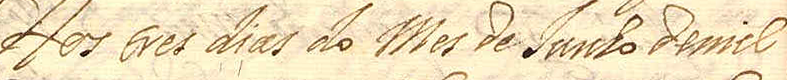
Aos tres dias do mes de Iunho de mil
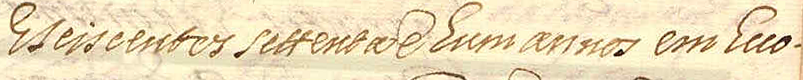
E seiscentos settenta e hum annos em Euo
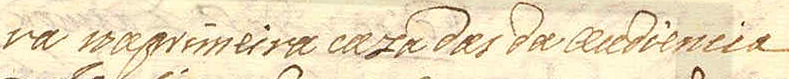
ra na primeira caza das da audiencia
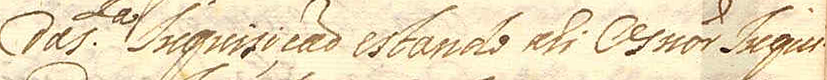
da s.ta Inquisição estando ahi O Sn̄or Inqui
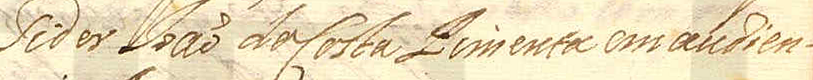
sidor Ioaõ da Costa Pimenta em audien
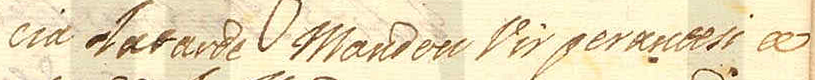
cia da tarde Mandou Vir perante si a
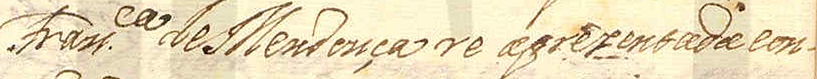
Fran.ca de Mendonça re aprezentada con
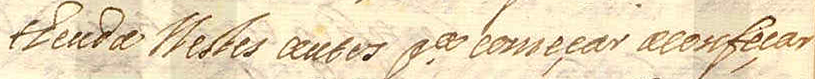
theuda nestes autos p.a começar a confeçar
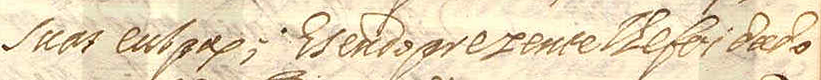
suas culpas; E sendo prezente lhe foi dado
